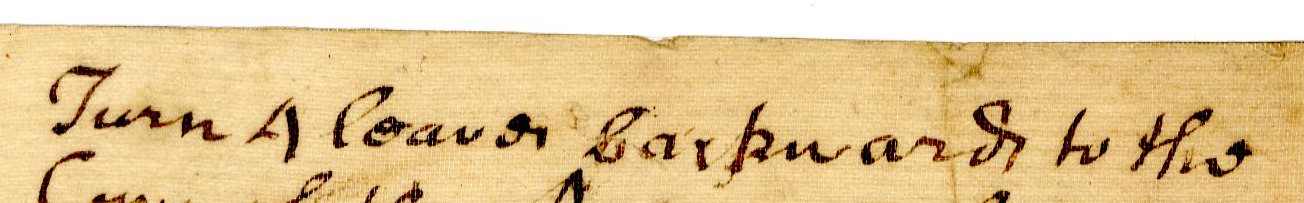Turn 4 leaves backward to the
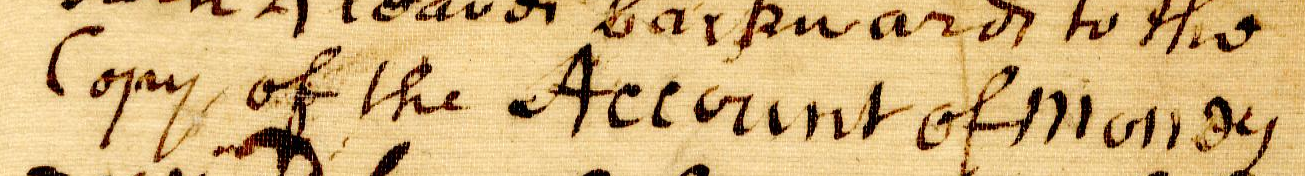Copy of the Account of Money
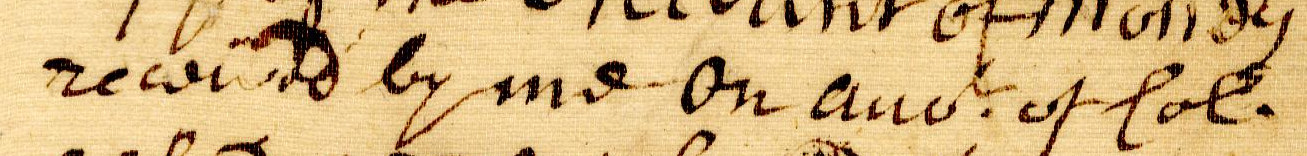recorded by me on acc^t. of Col.
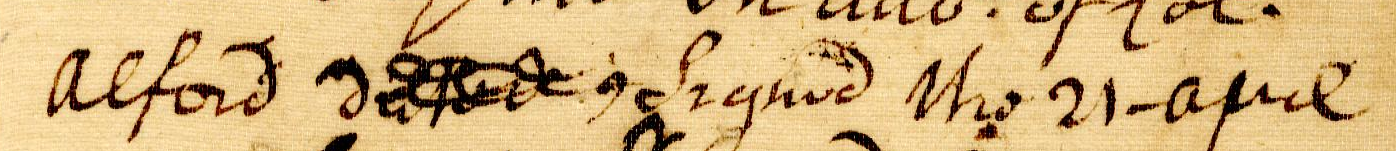Alford [_____] Signed the 21- April
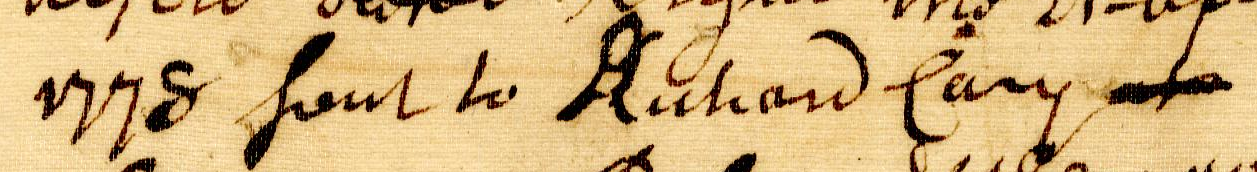1778 Sent to Richard Cary
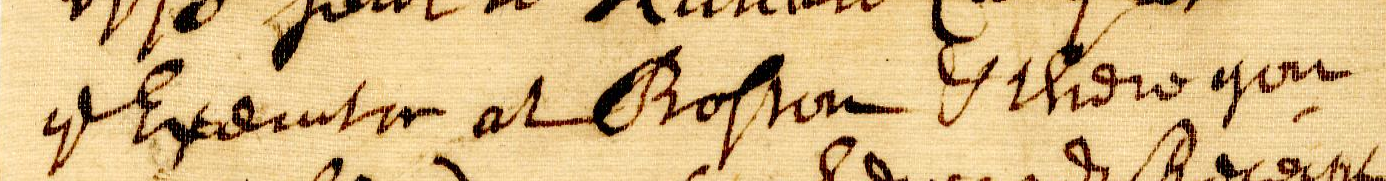y^e Executor at Roston & there you
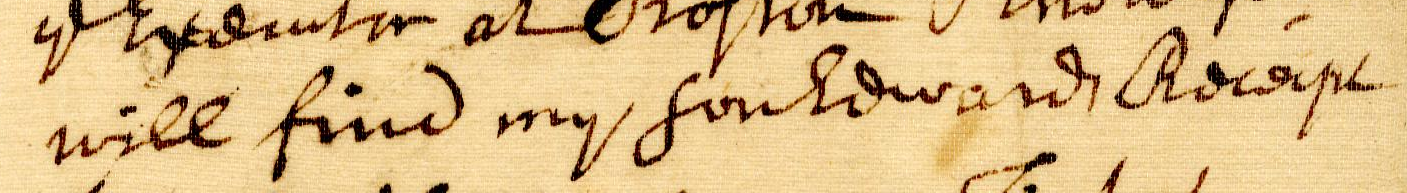will find my son Edwards Receipt
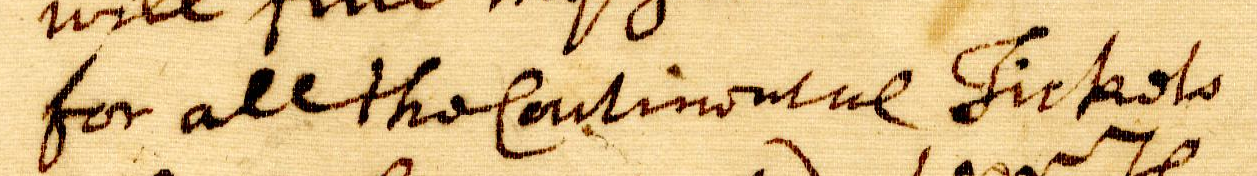for all the Continental Tickets
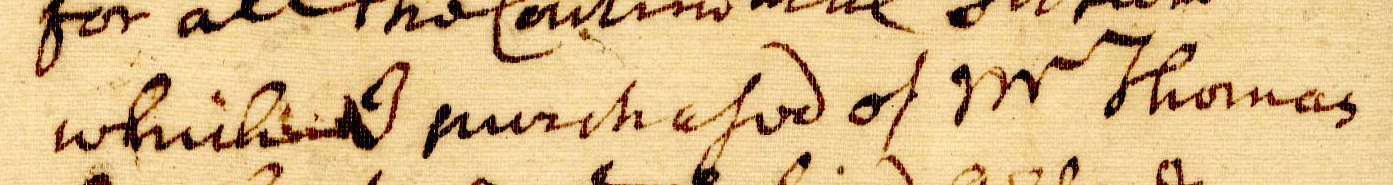which I purchased of M^r thomas
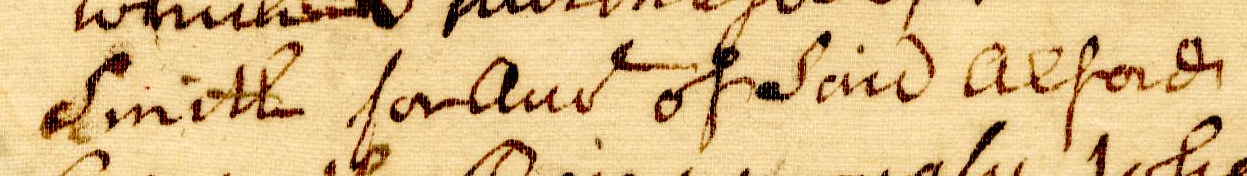Smith for Acco^t of Said Alford
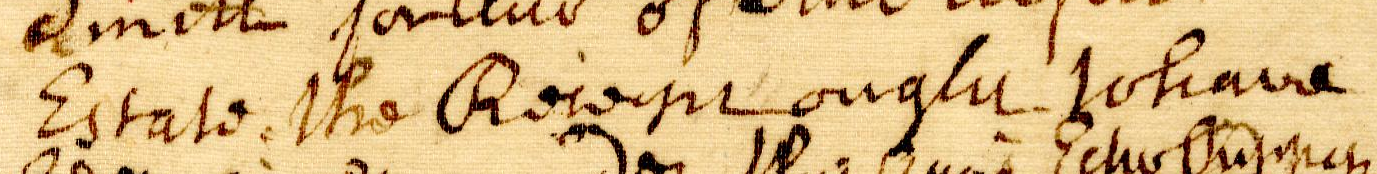Estate the Reciept ought to have
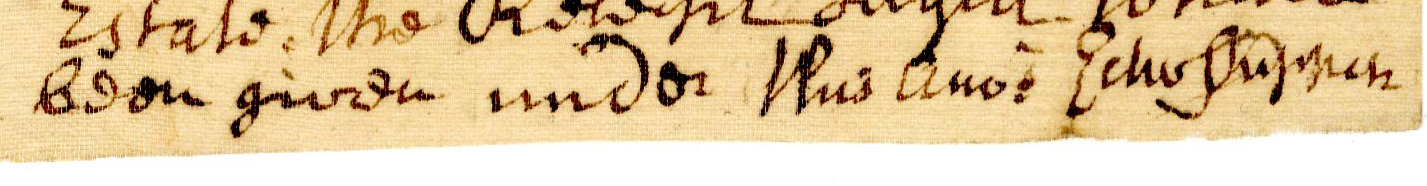been given under this Acco: Edw Shippen
